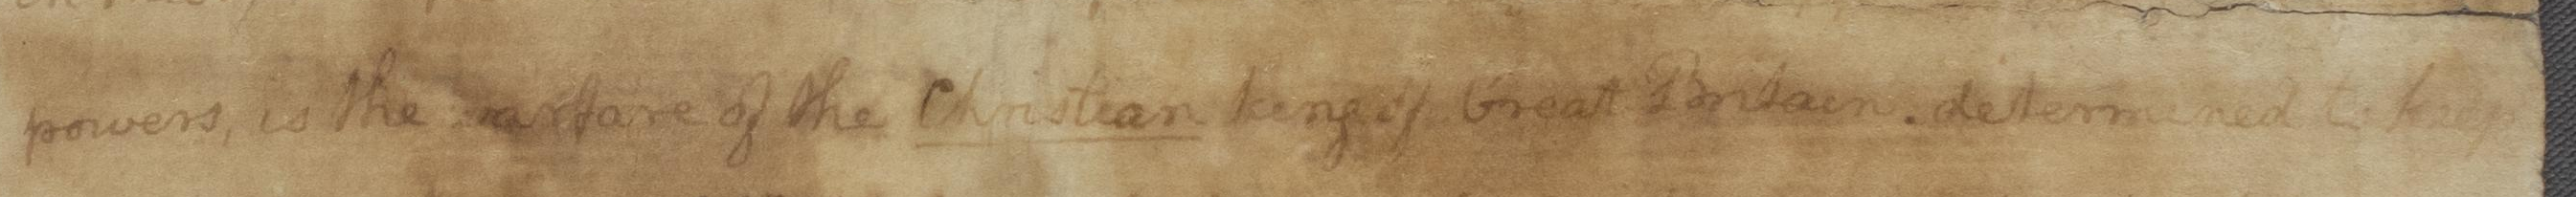powers is the warfare of the Christian King of Great Britain determined to keep
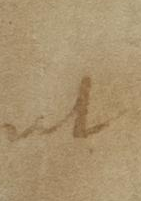out
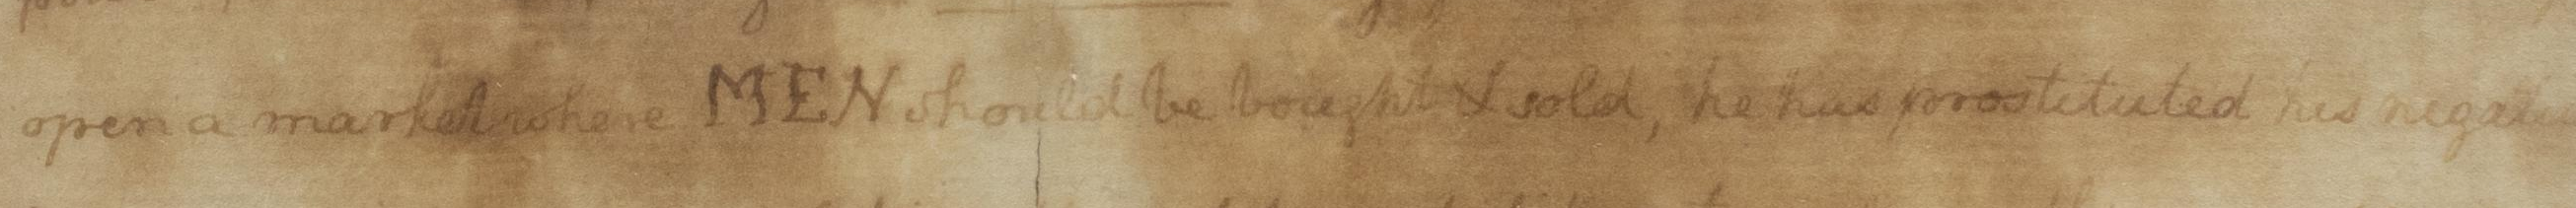open a market where MEN should be bought & sold, he has prostituted his regal
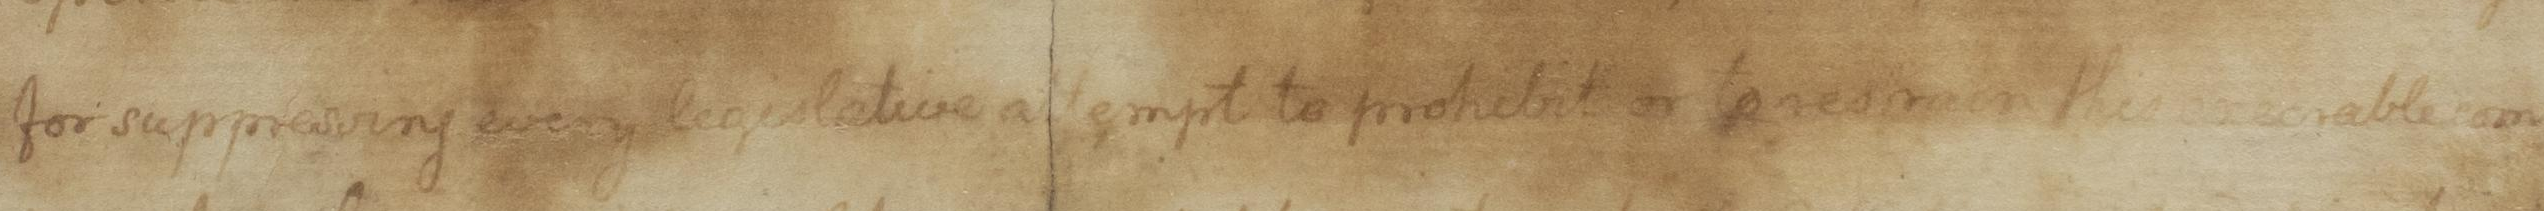for supporting every legislative attempt to prohibit or to reason their excusable
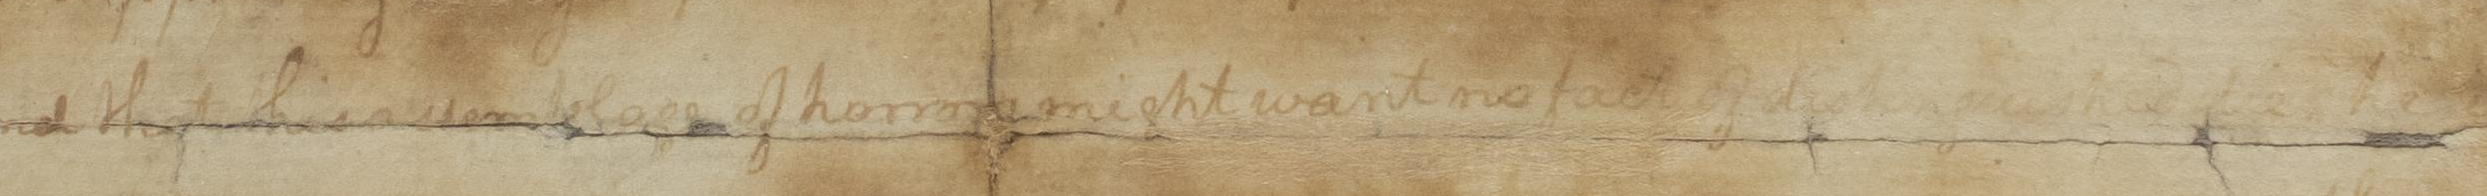and that his assemblage of horror might want no fact of distinguishable he
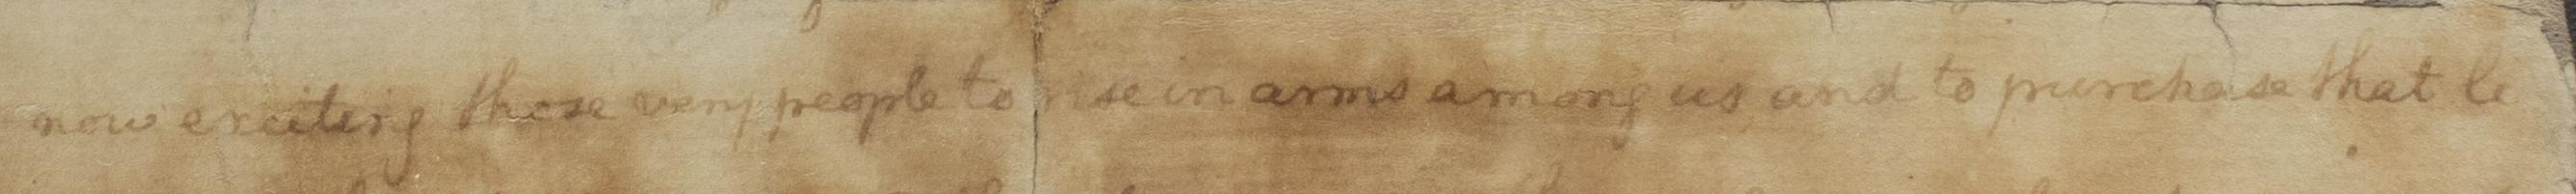now exiting these very people to rise in arms among us and to purchase that li-
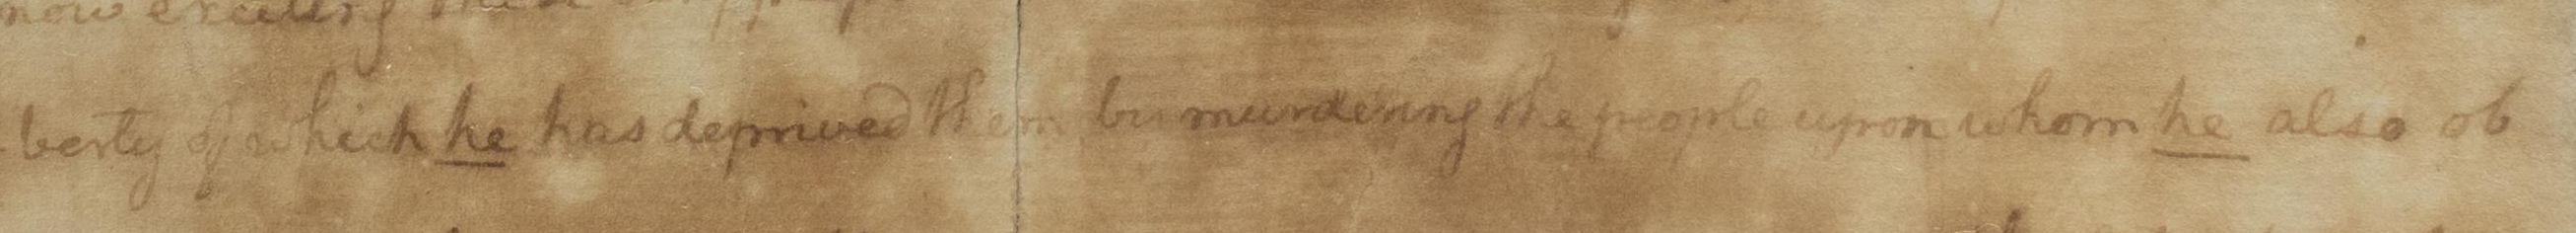-berty of which he has deprived them by murdering the people upon whom be also ob-
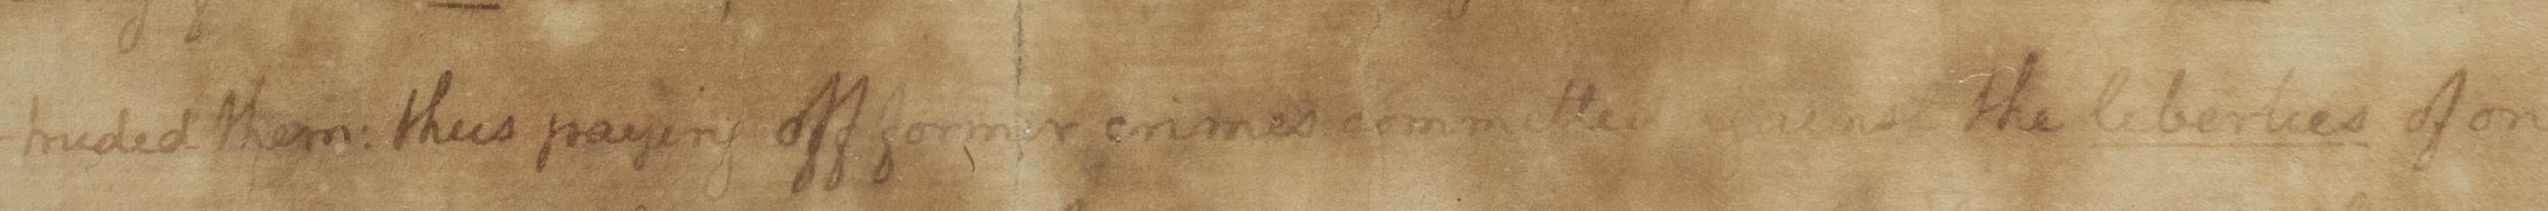-truded them. This praying off of our enemies the liberties of one
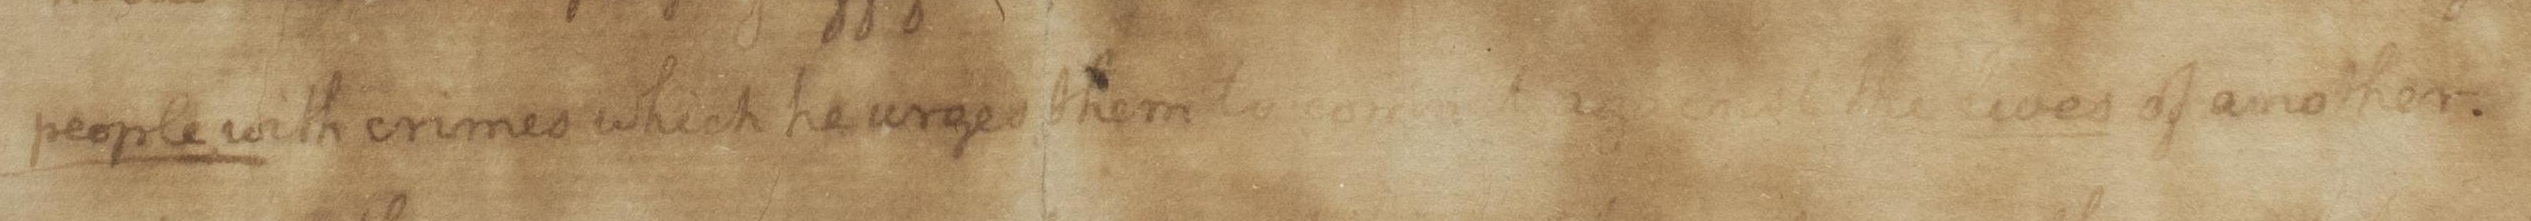people with crimes which he urged them to commit against the lives of another.
